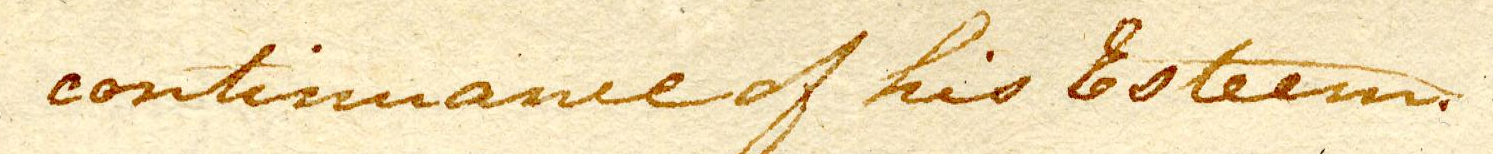continuance of his Esteem.
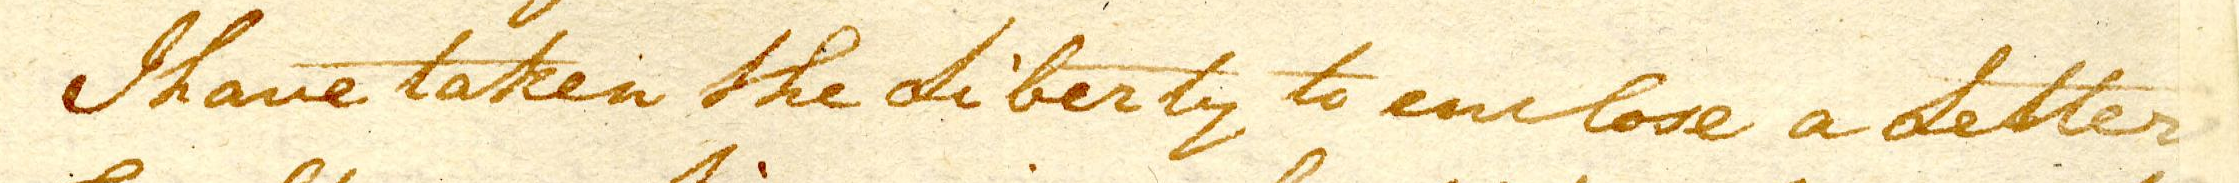I have taken the Liberty to enclose a Letter
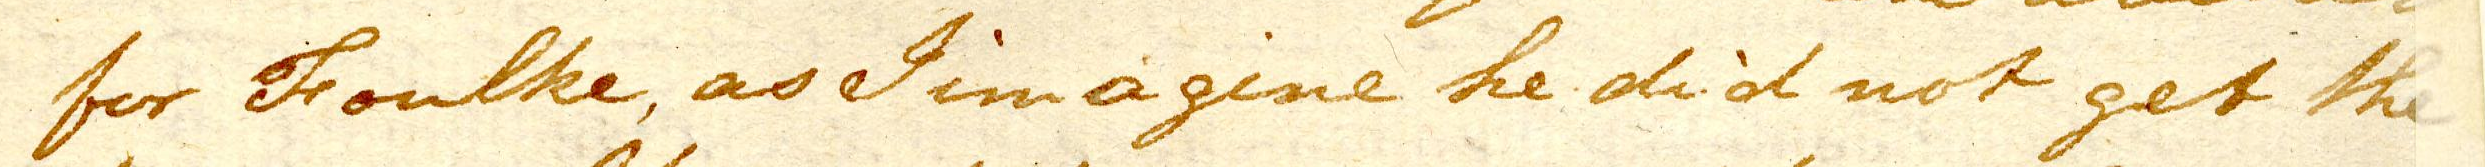for Foulke, as I imagine he did not get the
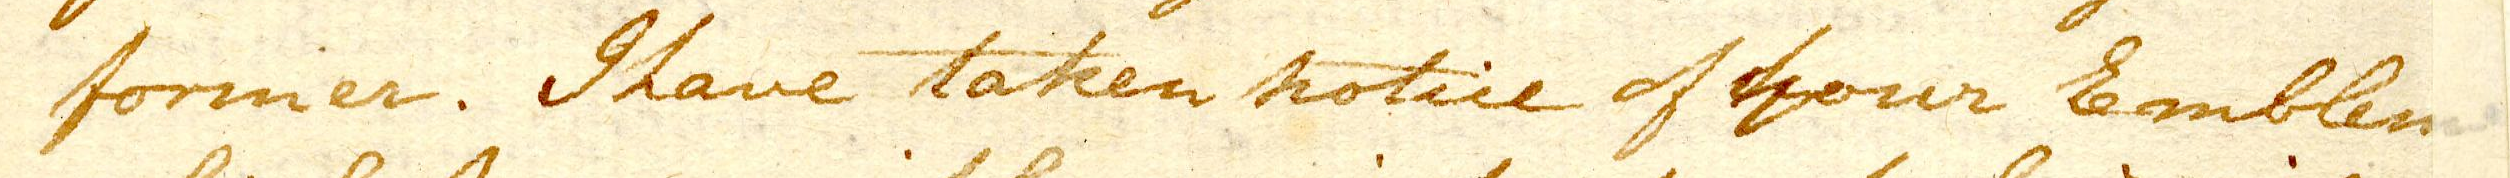former. I have taken notice of your Emblem
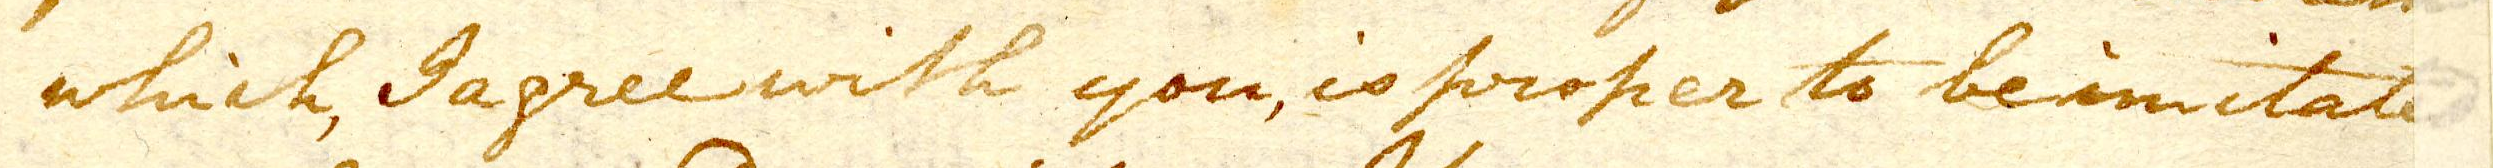which, I agree with you, is proper to be imitated
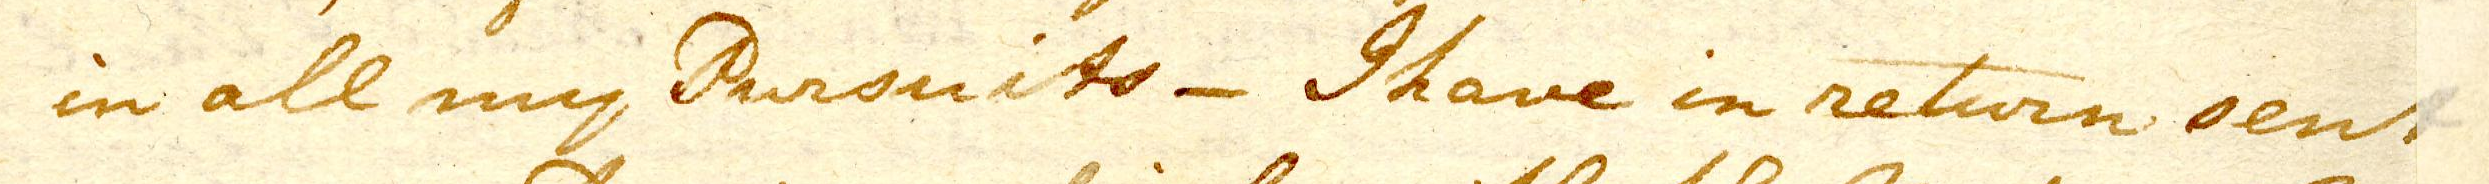in all my Pursuits- I have in return sent
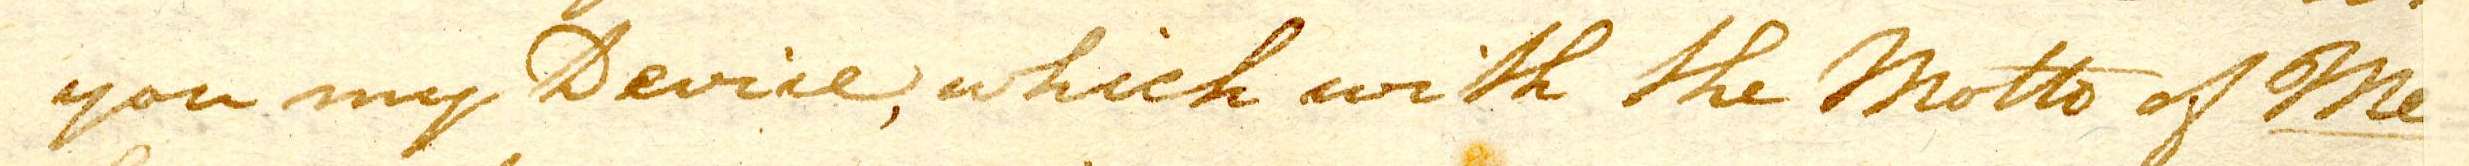you my Device, which with the Motto of Me
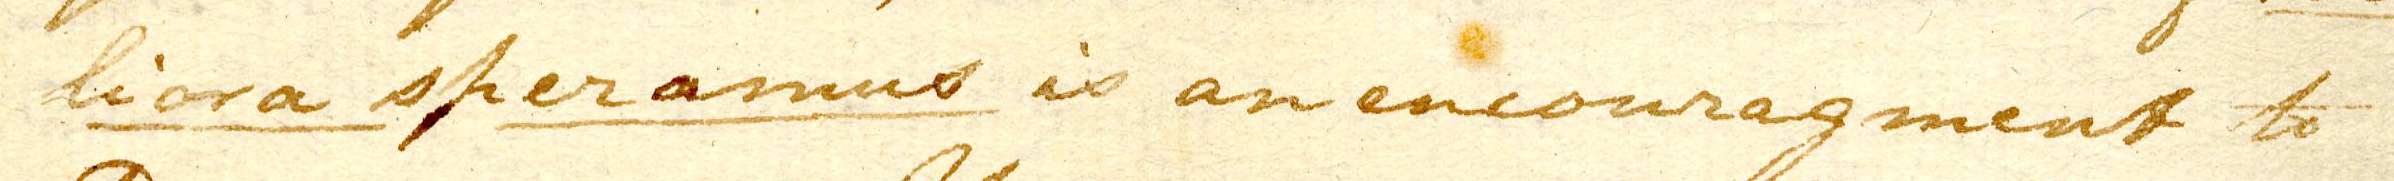liora speramus is an encouragment to
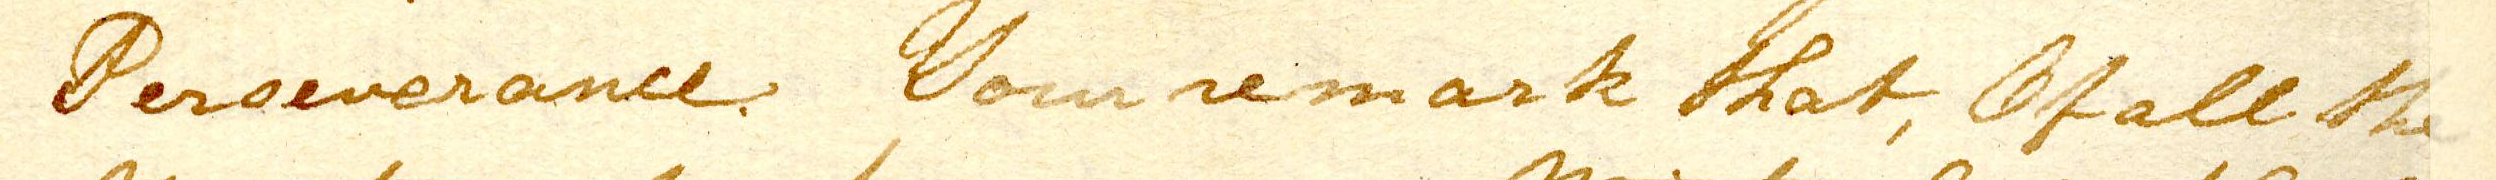Perseverance. Your remark that, Of all the
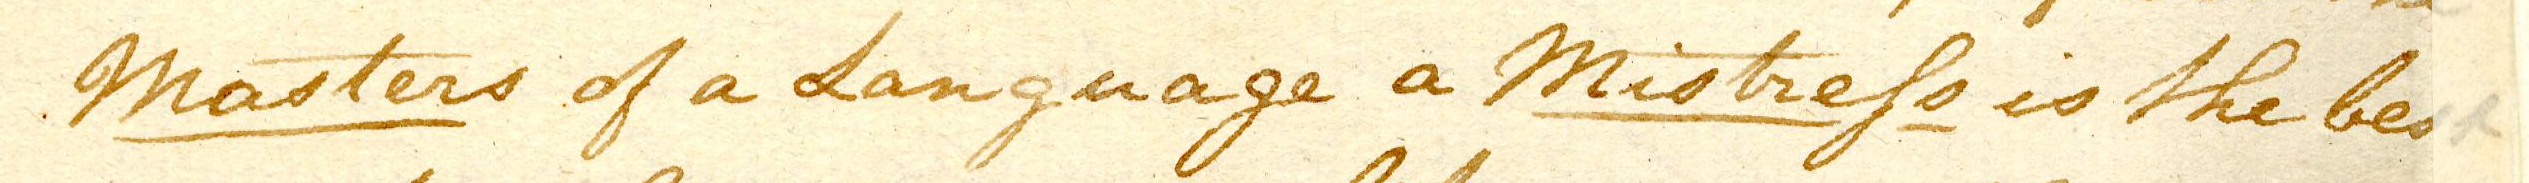Masters of a Language a Mistress is the best
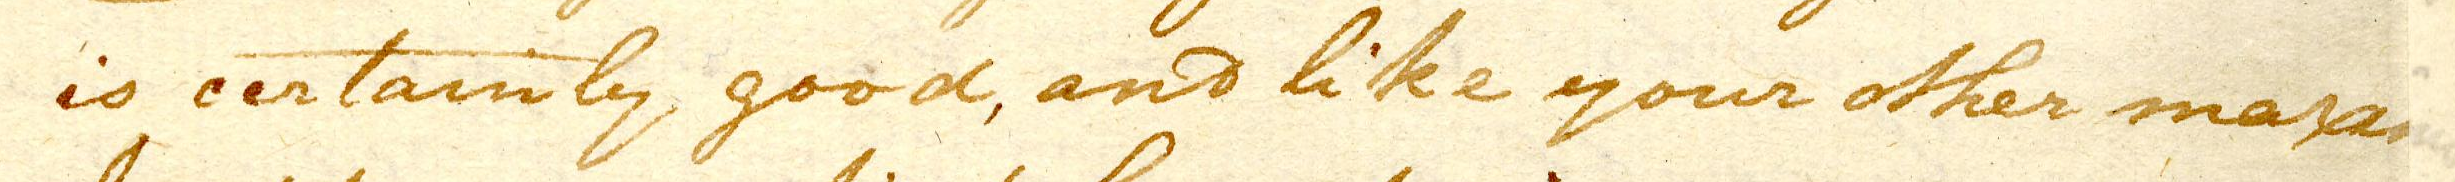is certainly good, and like your other maxims
